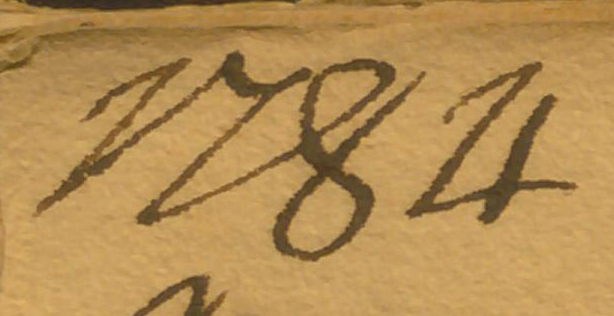1784
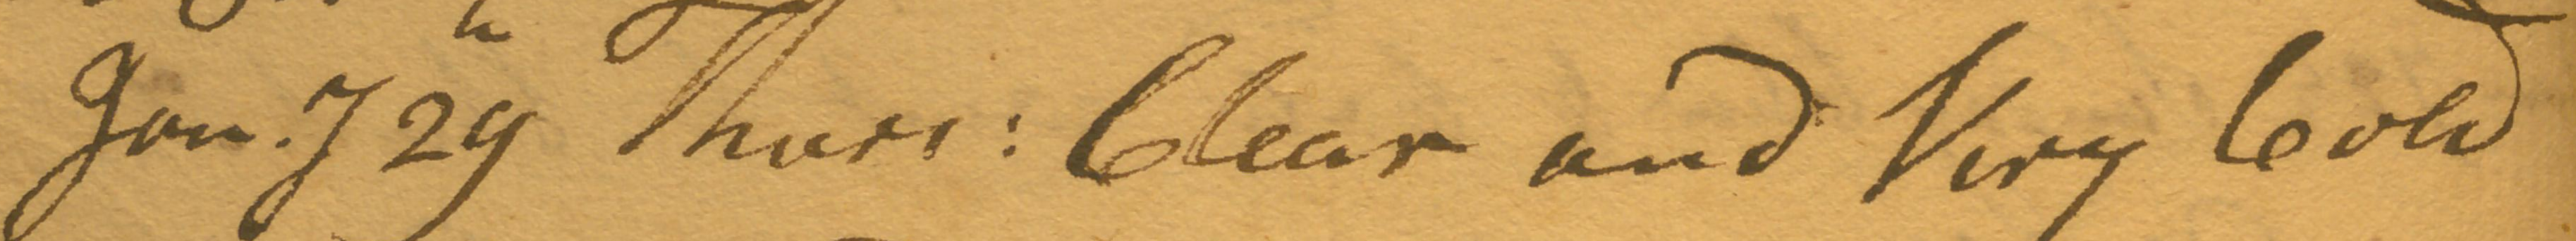Jan^y. 29^th Thurs: Clear and Very Cold
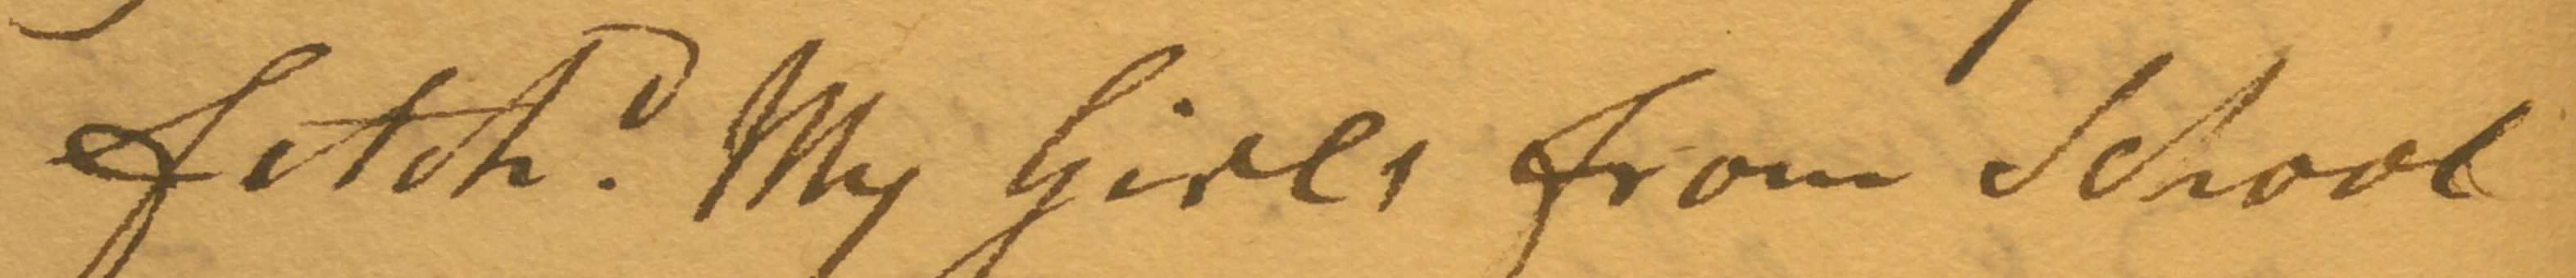fetch^d. My Girls from School
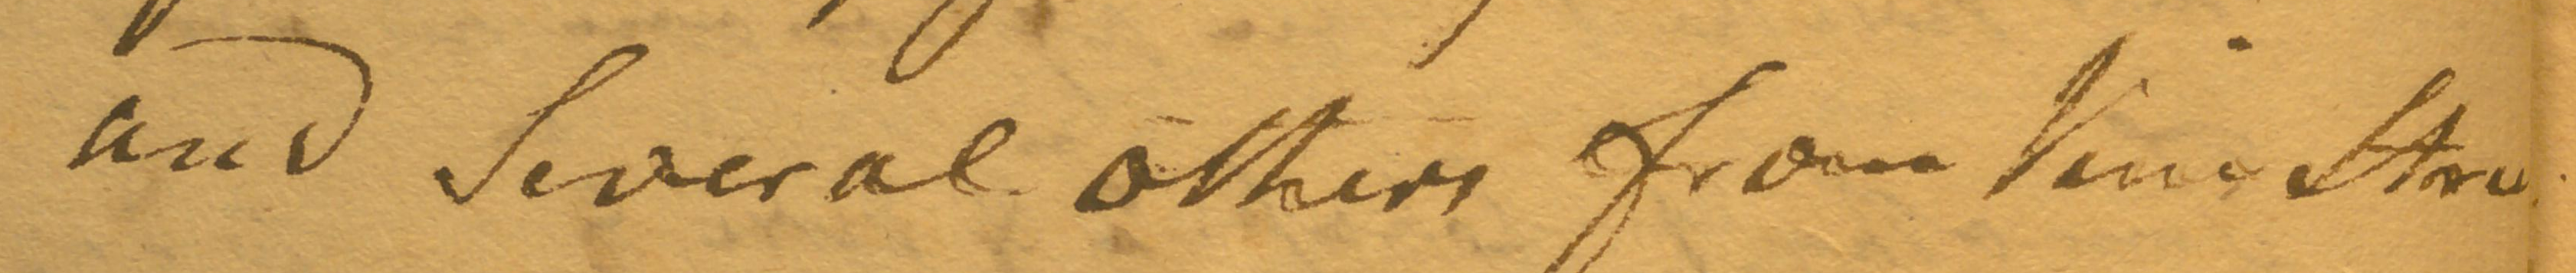and several others from Vine Stre
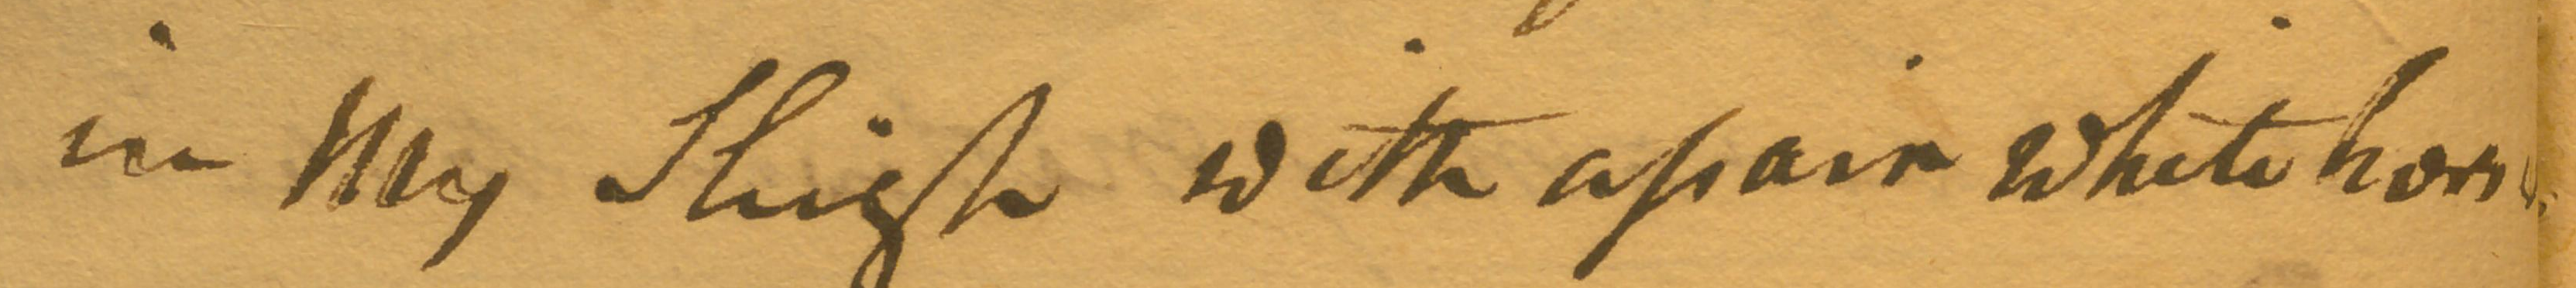in My Sleigh with a pair white hors
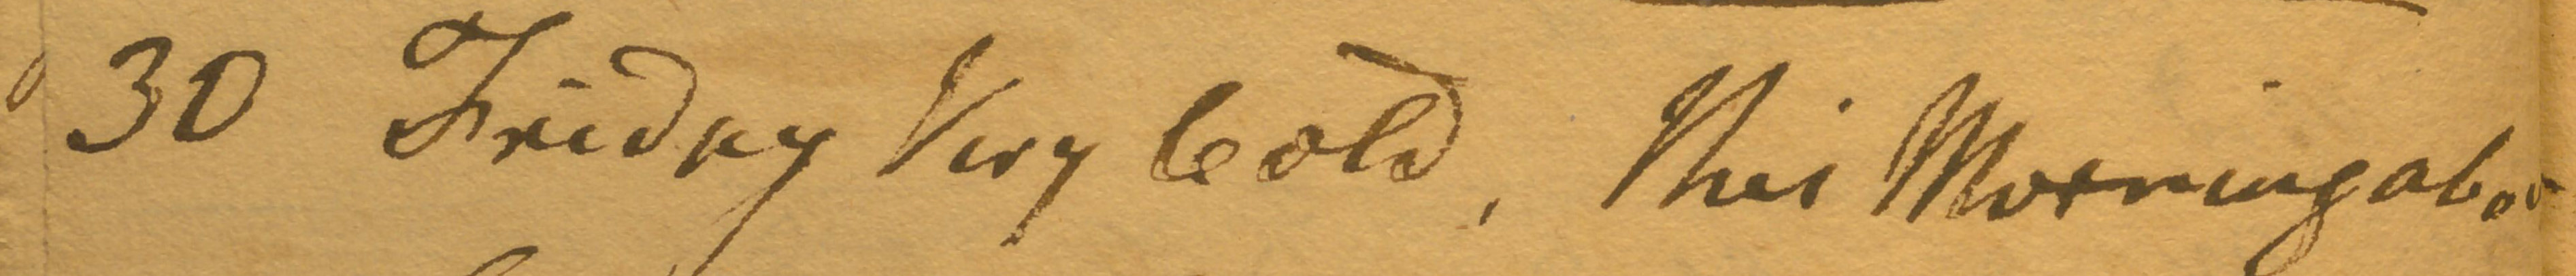30 Friday Very Cold. this Morning abo
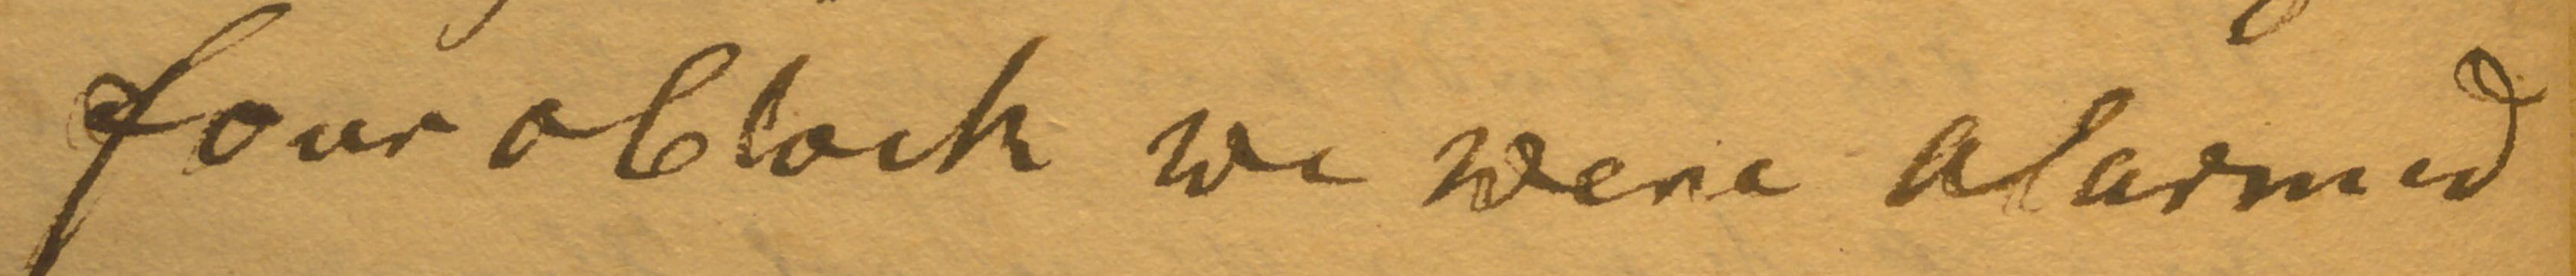four oClock we were alarmed
